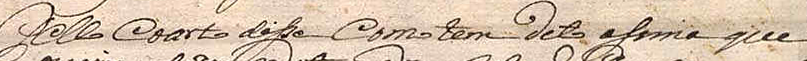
Pello coarto disse como tem dito asima que
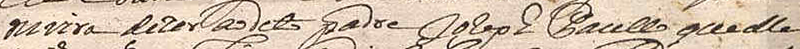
ouvira dizer ao dito padre Jozeph Paullo que elle
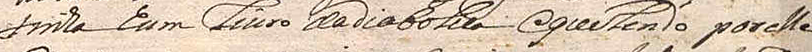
tinha hum Liuro da diabolica e que lendo por elle
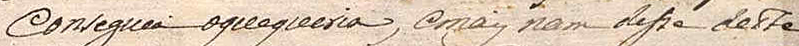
conseguia o que queria, e mais nam disse deste
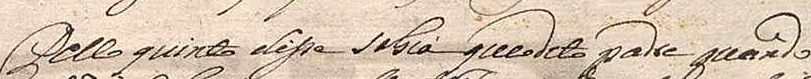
Pello quinto disse sabia que o dito padre quando
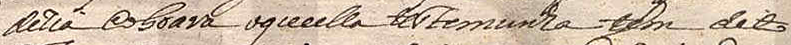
dezia e obrava o que ella testemunha tem dito
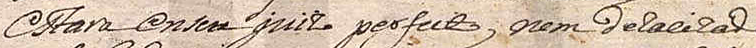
estara en seu juizo perfeito, nem dezacizado
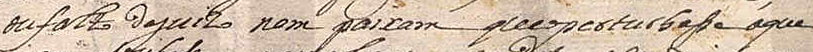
ou falto de juizo nem paixam que o perturbasse o que
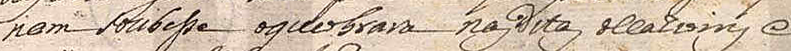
nam soubesse o que obrava nas ditas occazioins e
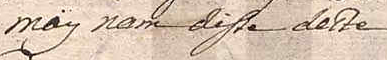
mais nam disse deste
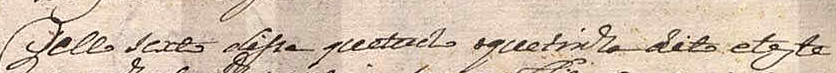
Pello sexto disse que tudo o que tinha dito e teste
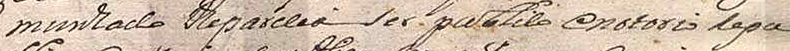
munhado lhe parecia ser publico e notorio de pu
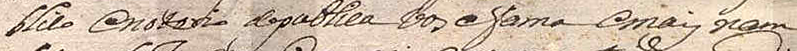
blico e notorio de publica vos e fama e mais nam
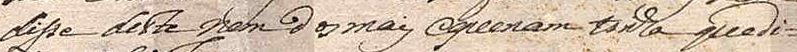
disse deste nem dos mais e que nam tinha que di
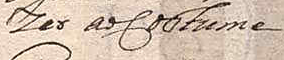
zer ao Costume
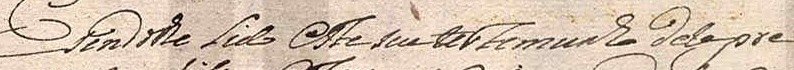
E sendo lhe lido este seu testemunho deza pre
